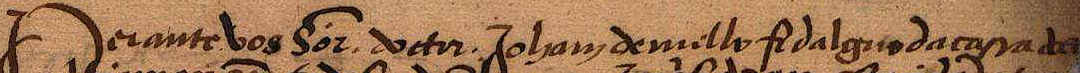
Perante vos Sōr. doctor. Joham de mello fidalguo da cassa del
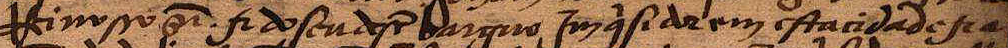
Rei nosso s̄or. e do seu desēbarguo Jmqisidor em esta cidade e a
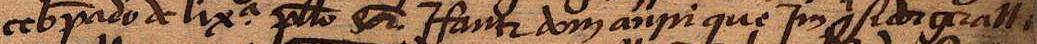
cebp̄ado de lix.a p̄llo Sōr Jfante dom anrrique Jmqisidor gerall e
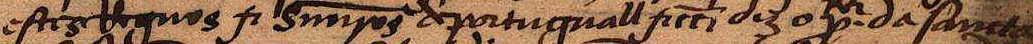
estes Regnos e Sn̄nros de portuguall e c̄c diz o ꝓor. da sancta
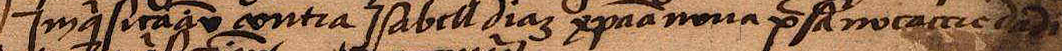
Jmqisicaão contra Jsabell diaz xpāa noua p̄sa no cacere da di
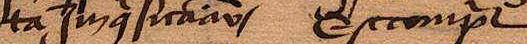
ta Jmqisicãao/ E se compir
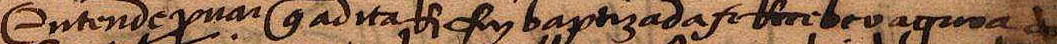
Entende ꝓuar q̄ a dita R foy baptizada e Recebeo aguoa do
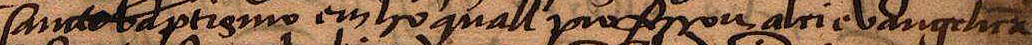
sancto baptismo em ho quall professou a lei evangelica
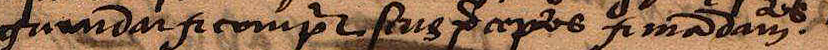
guoardar e compir seus p̄ceptos e mādamtos.
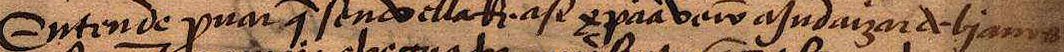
Entende ꝓuar q̄ sendo ella Re asi xpāa veio a Judaizar de bj anos
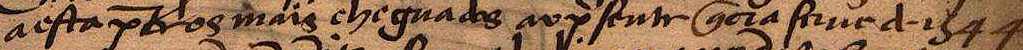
a esta p̄te os mais cheguados ao p̄sente q̄ ora serue de i544
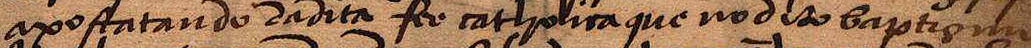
apostatando da dita fee catholica que no dito baptismo
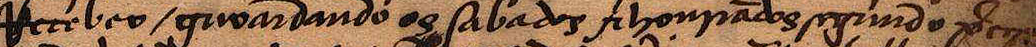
Recebeo / guoardando os sabados e honrrādos segundo p̄cep
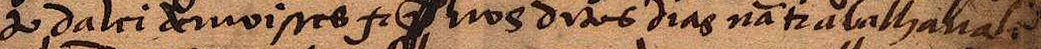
to da lei de moisses e p̄o nos ditos dias nā trabalhaua ē
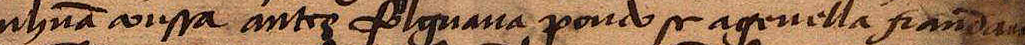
nhūa coussa antes folguaua pondo se a genella e andan
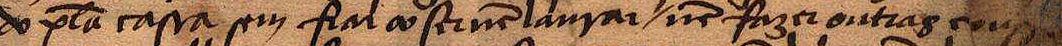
do p̄la cassa sem fiar coser nē laurar / nē fazer outras coussas
